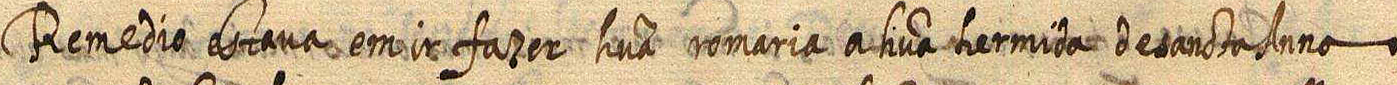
Remedio estaua em ir fazer huā romaria a huā hermida de sancta Anna
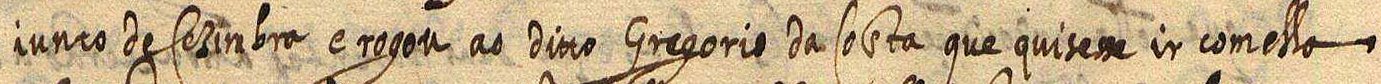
iunto de Cezimbra e rogou ao ditto Gregorio da Costa que quisesse ir com ella
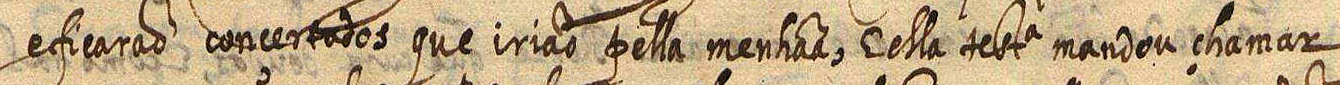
e ficaraõ conçertados que irião pella menhāa, E ella testa mandou chamar
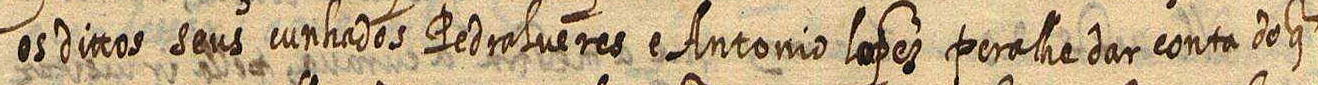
os dittos seus cunhados Pedralueres e Antonio lopēz pera lhe dar conta do q̄
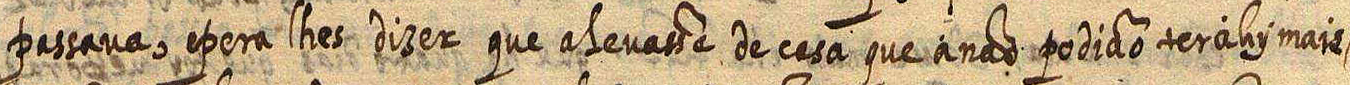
passaua, e pera lhes dizer que a leuassē de casa que a naõ podiaõ ter ahy mais /
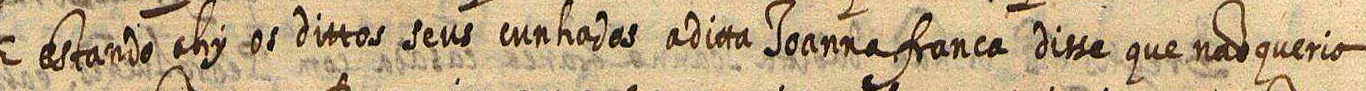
E estando ahy os dittos seus cunhados a ditta Ioanna franca disse que naõ queria
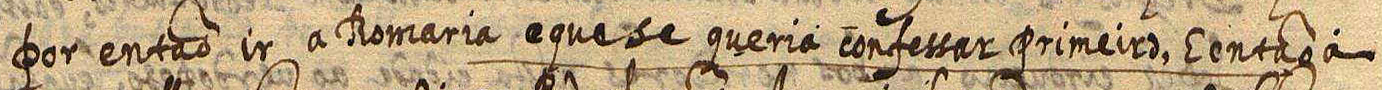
por então ir a Romaria e que se queria confessar primeiro, E entaõ a
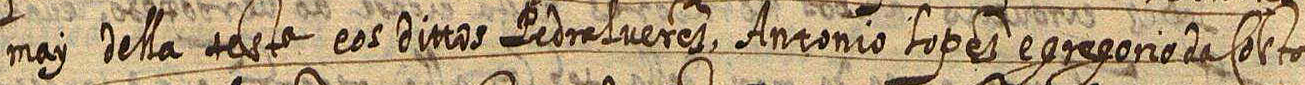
may della testa e os dittos Pedraluerēz, Antonio lopez̄ e gregorio da Costa
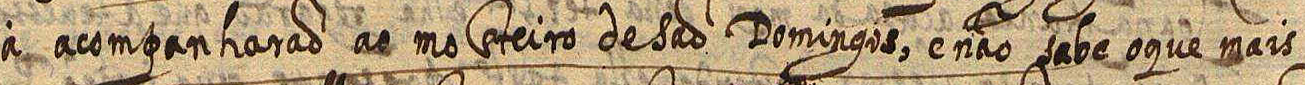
a acompanharaõ ao mosteiro de Saõ Domingos, e não sabe o que mais
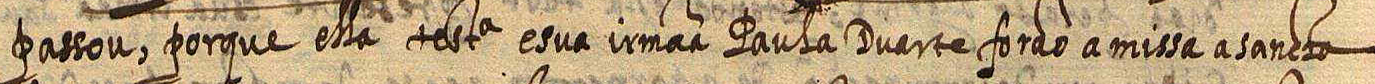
passou, porque ella testa e sua irmāa Paula Duarte forão a missa a sancta
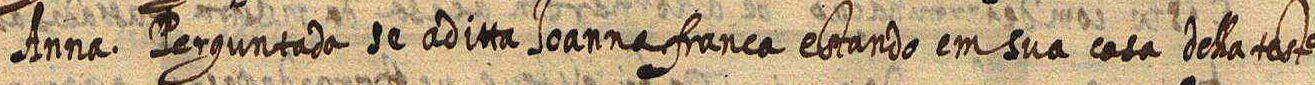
Anna. Perguntada se a ditta Ioanna franca estando em sua casa della testa
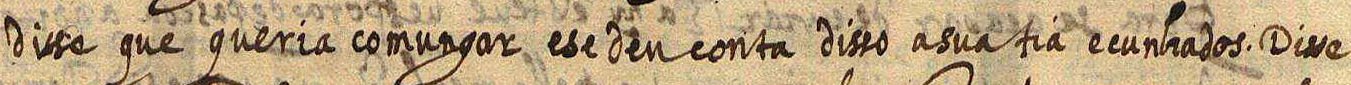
disse que queria comungar e se deu conta disso a sua tia e cunhados. Disse
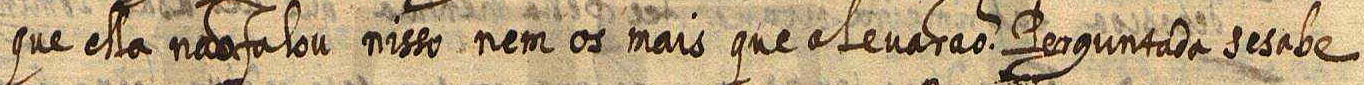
que ella naõ falou nisso nem os mais que a leuarão. Perguntada se sabe
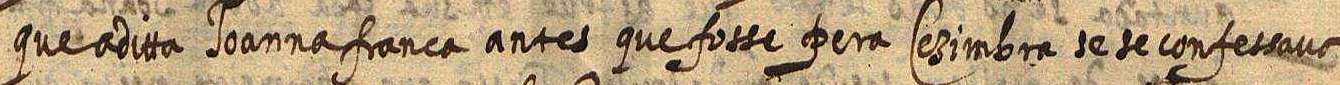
que a ditta Ioanna franca antes que fosse pera Cezimbra se se confessaua
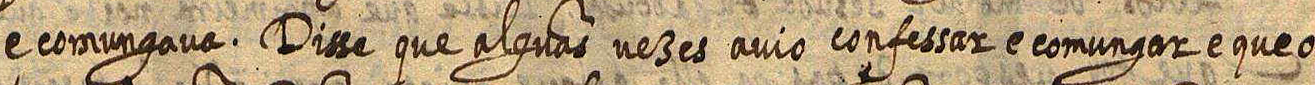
e comungaua. Disse que alguās uezes a uio confessar e comungar e que o
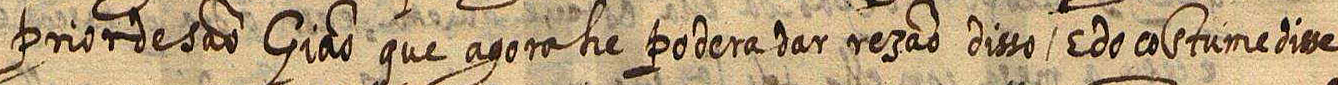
prior de são Gião que agora he podera dar rezão disso / E do costume disse
